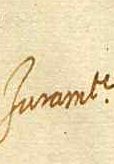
Juramt.o
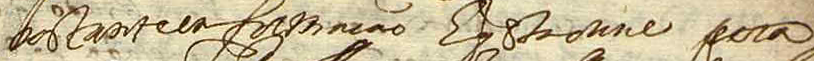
bastante enformaçaõ E q̄ esta ouue pera
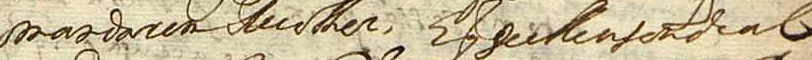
o mandarem Recolher, E q̄ se elle entende al
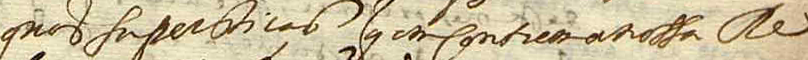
guas̄ superstiçaõ q̄ emContrem a nossa Re
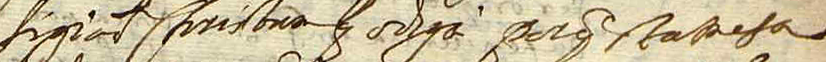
Ligiaõ Christam q̄ o diga porq̄ esta mesa
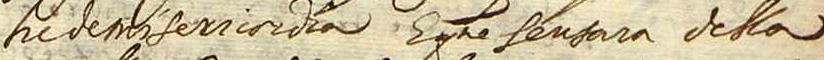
he de misericordia E que se usara della
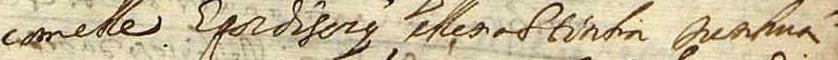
com elle E por diser q̄ elle naõ tinha nenhuā
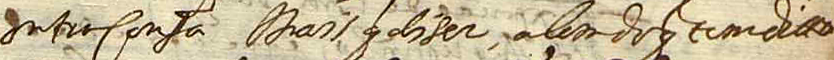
outra Cousa Mais q̄ diser, alem do q̄ tem ditto
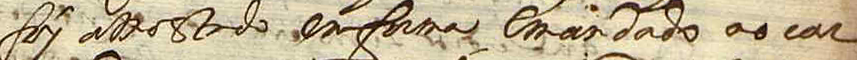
foy amoestado em forma & mandado ao car
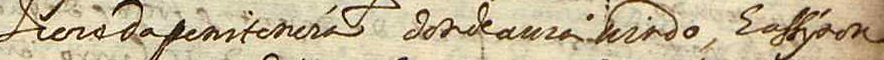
cere da penitencia donde auia uindo, E assynou
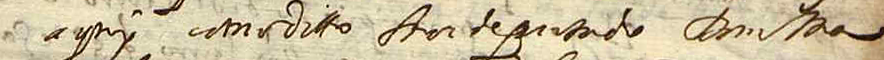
aquy com o ditto sn̄or deputado Dom Ma
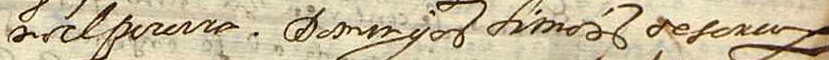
noel pereira. Domingos Simois o escreuj
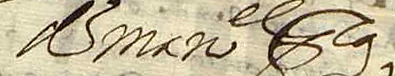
dō manoel pra
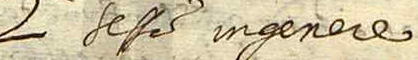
2a sessaõ in genere
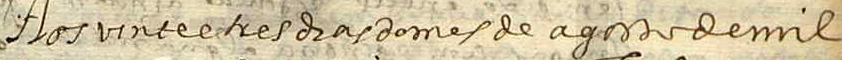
Aos vinte e tres dias do mes de agosto de mil
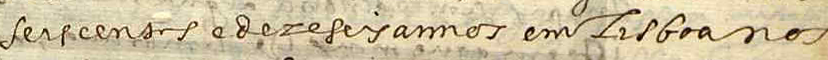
seiscentos e dezeseis annos em Lisboa nos
